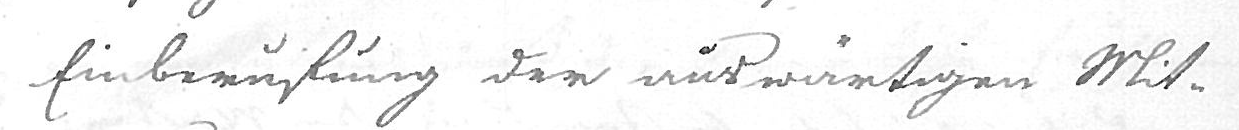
Einberufung der auswärtigen Mit-
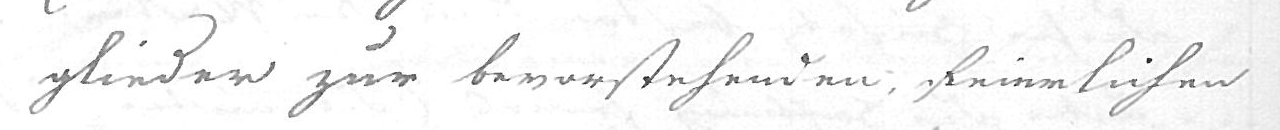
glieder zur bevorstehenden feierlichen
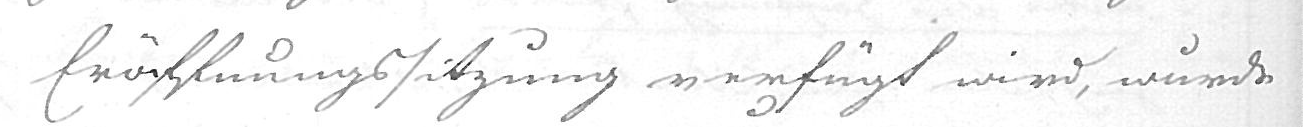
Eröffnungssitzung verfügt wird, wurde
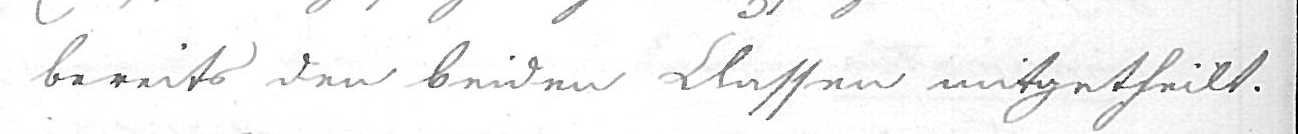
bereits den beiden Classen mitgetheilt
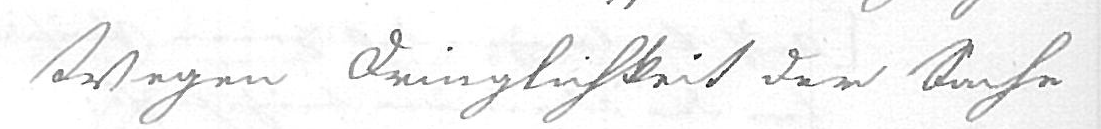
Wegen Dringlichkeit der Sache
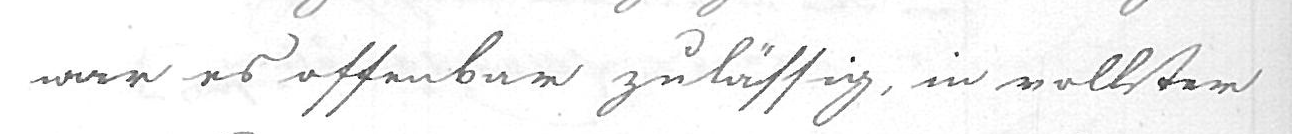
war es offenbar zulässig, in vollster
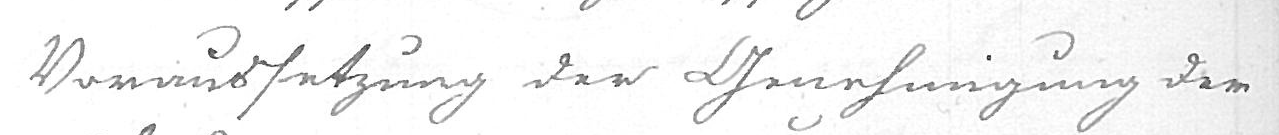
Voraussetzung der Genehmigung der
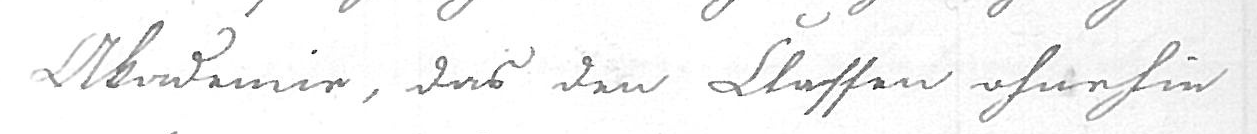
Akademie, das den Classen ohnehin
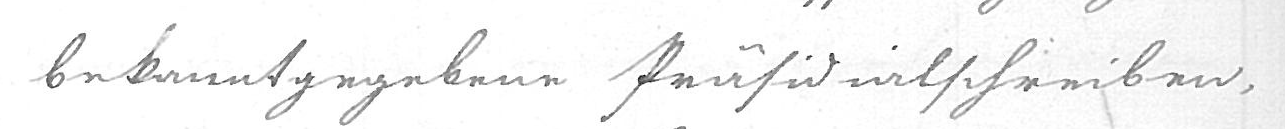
bekanntgegebene Präsidialschreiben
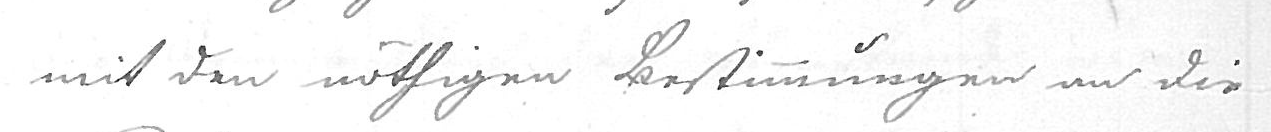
mit den nöthigen Bestimmungen an die
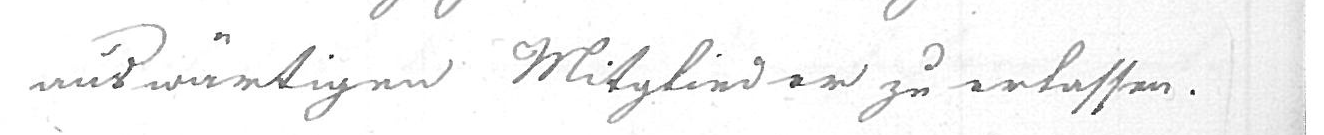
auswärtigen Mitglieder zu erlassen.
